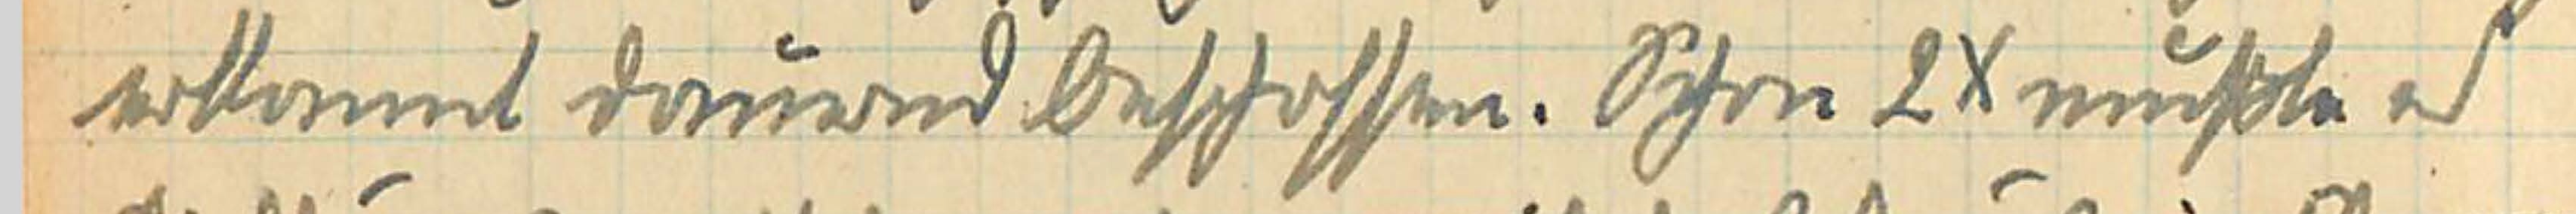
erkannt dauernd beschossen. Schon 2 x mußte es
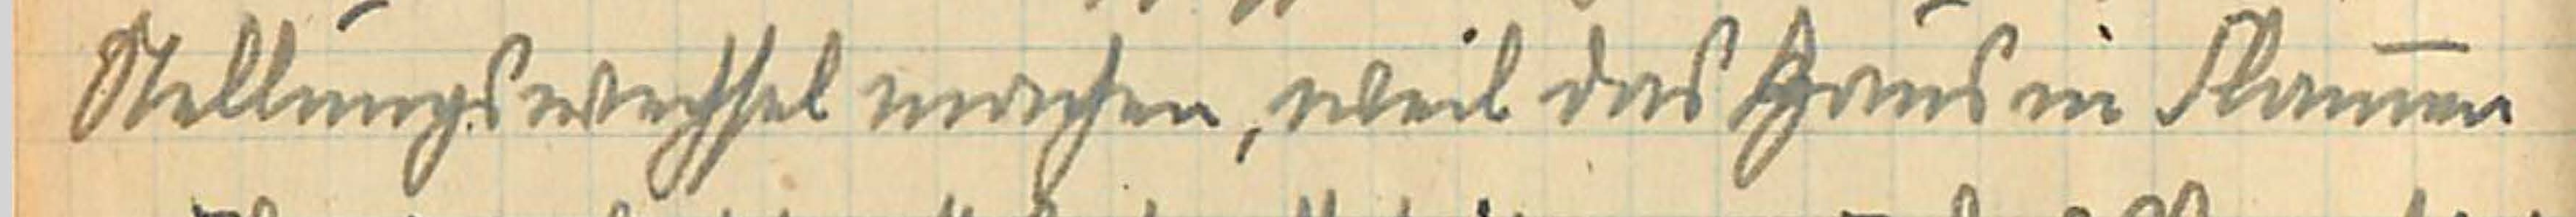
Stellungswechsel machen, weil das Haus in Flammen
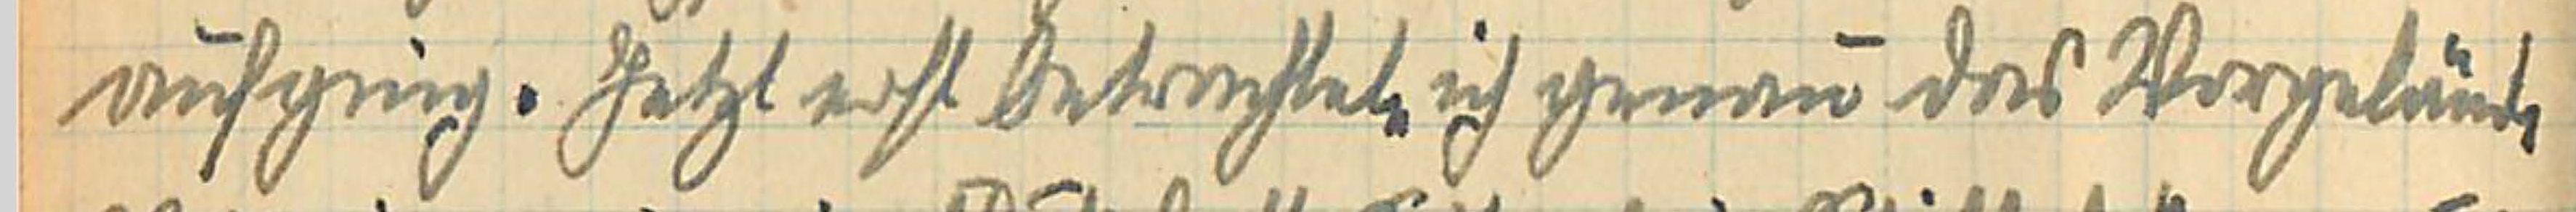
aufging. Jetzt erst betrachtete ich genau das Vorgelände.
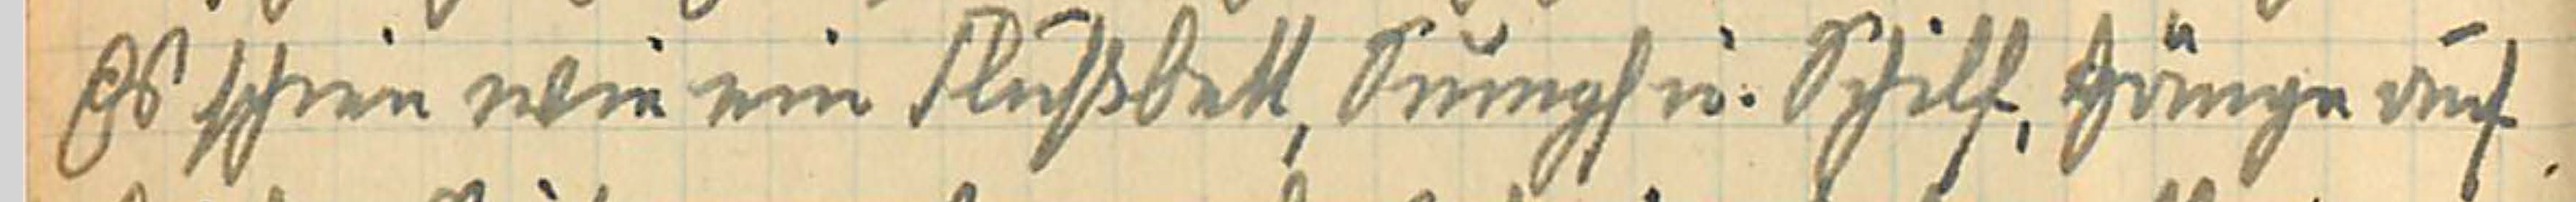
Es schien wie ein Flußbett, Sumpf u. Schilf, Hänge auf
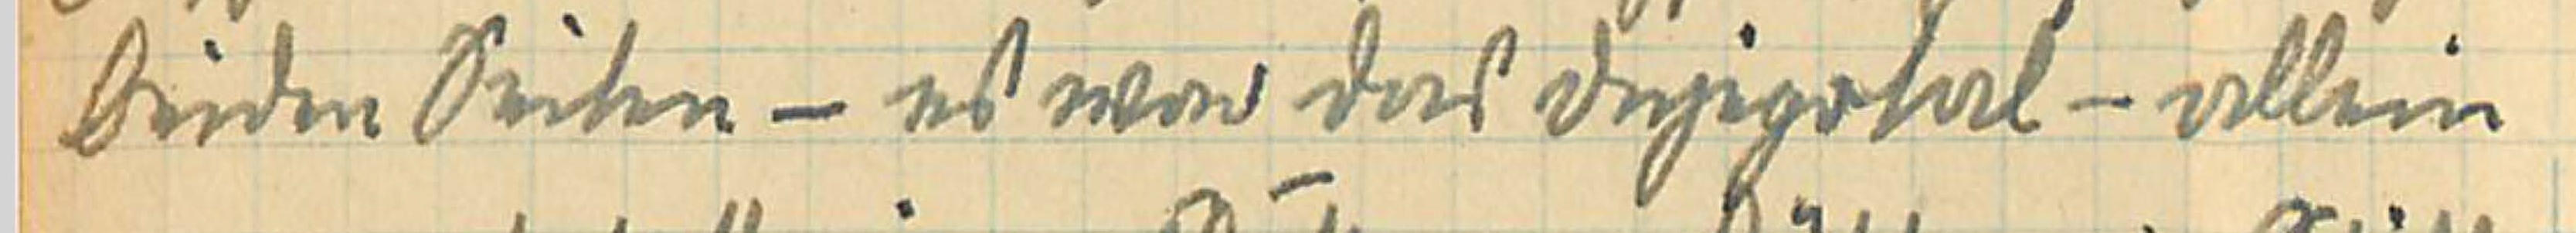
beiden Seiten – es war das Dnjeprtal – allein
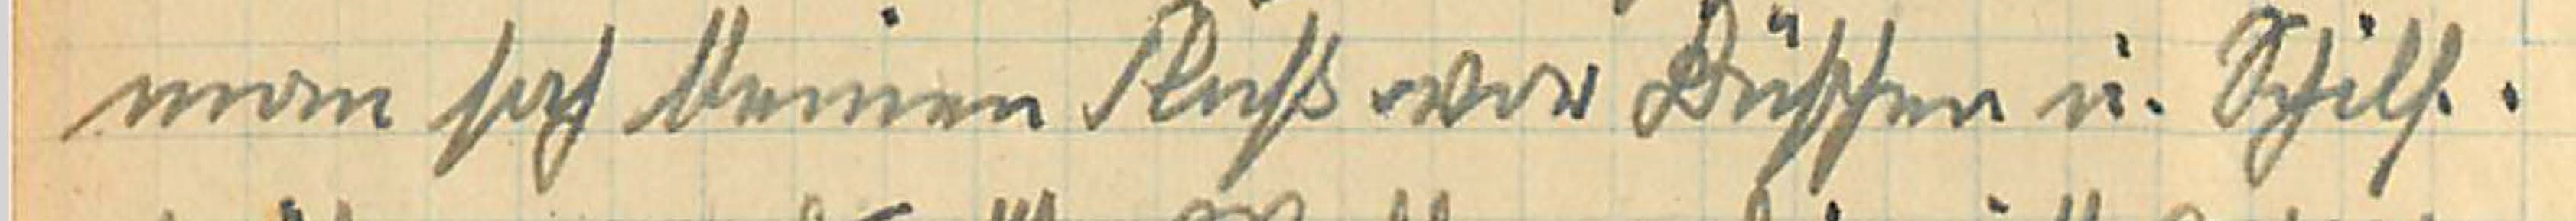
man sah keinen Fluß vor Büschen u. Schilf.
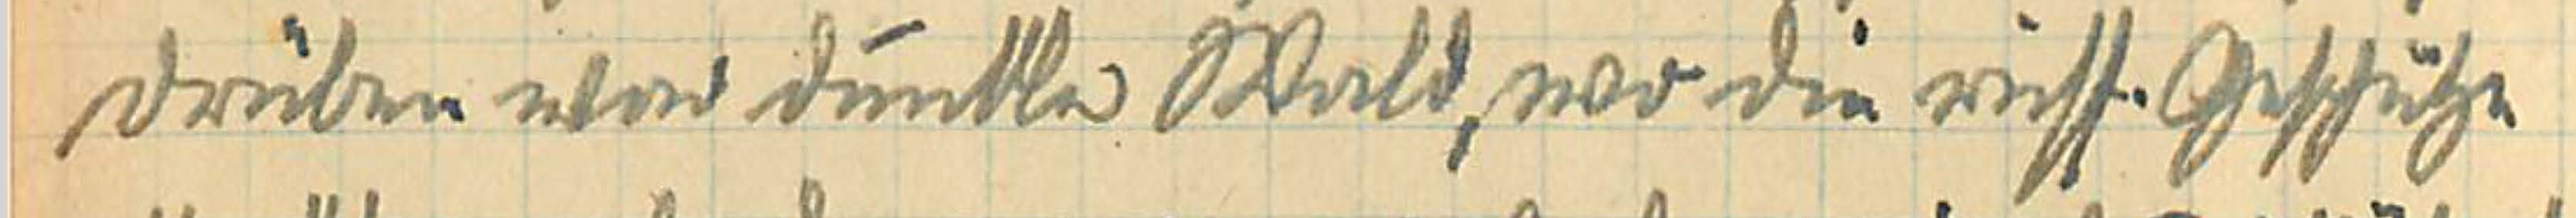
Drüben war dunkler Wald, wo die russ. Geschütze
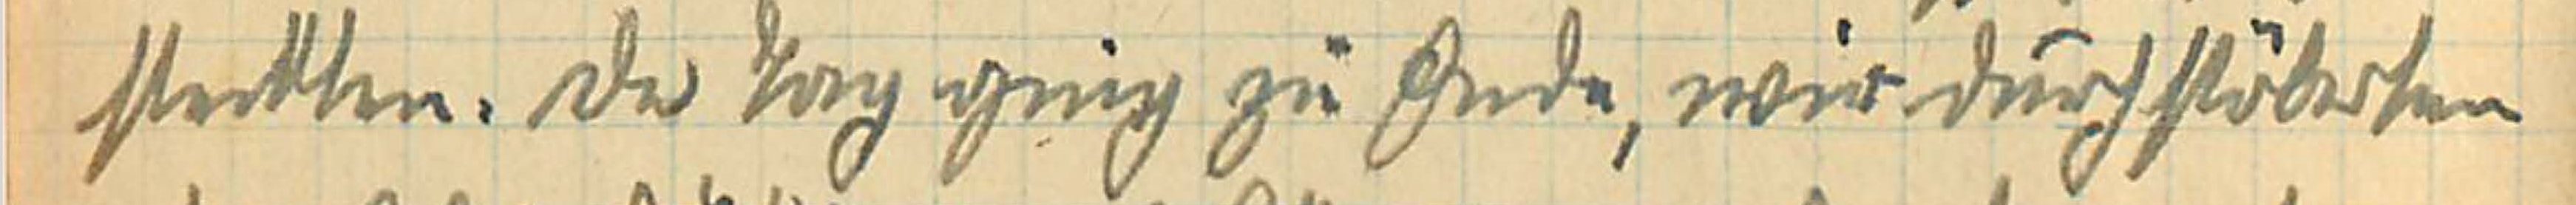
steckten. Der Tag ging zu Ende, wir durchstöberten
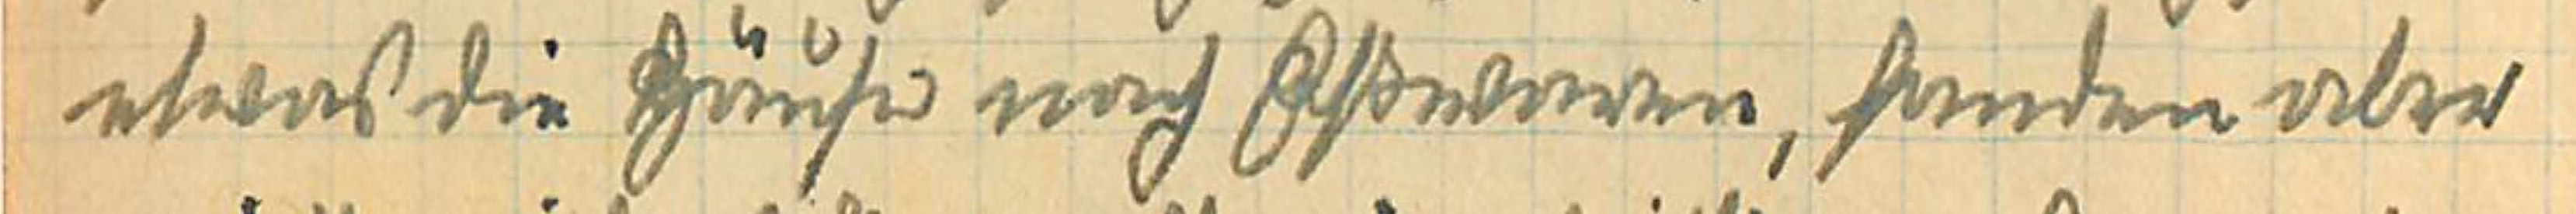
etwas die Häuser nach Eßwaren, fanden aber
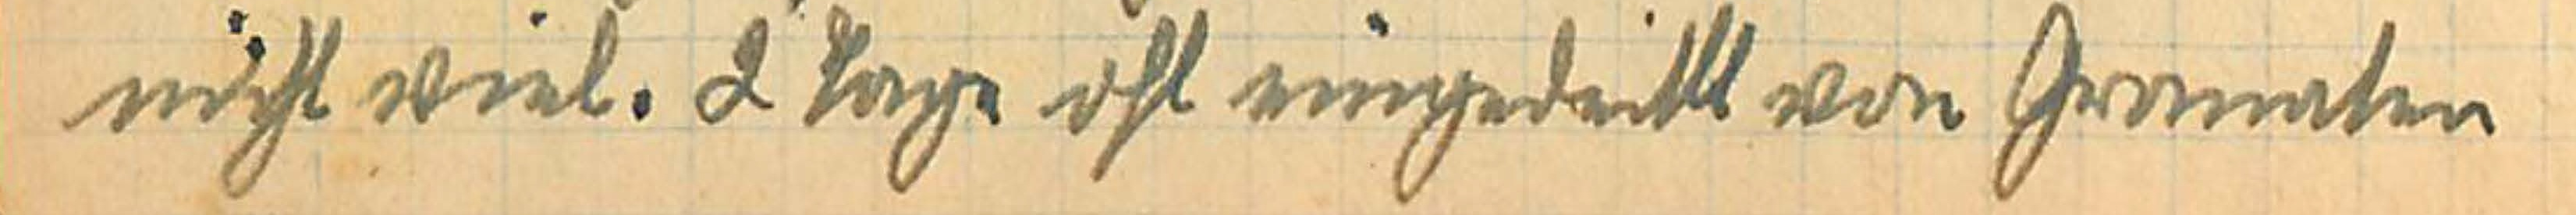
nicht viel. 2 Tage oft eingedeckt von Granaten
